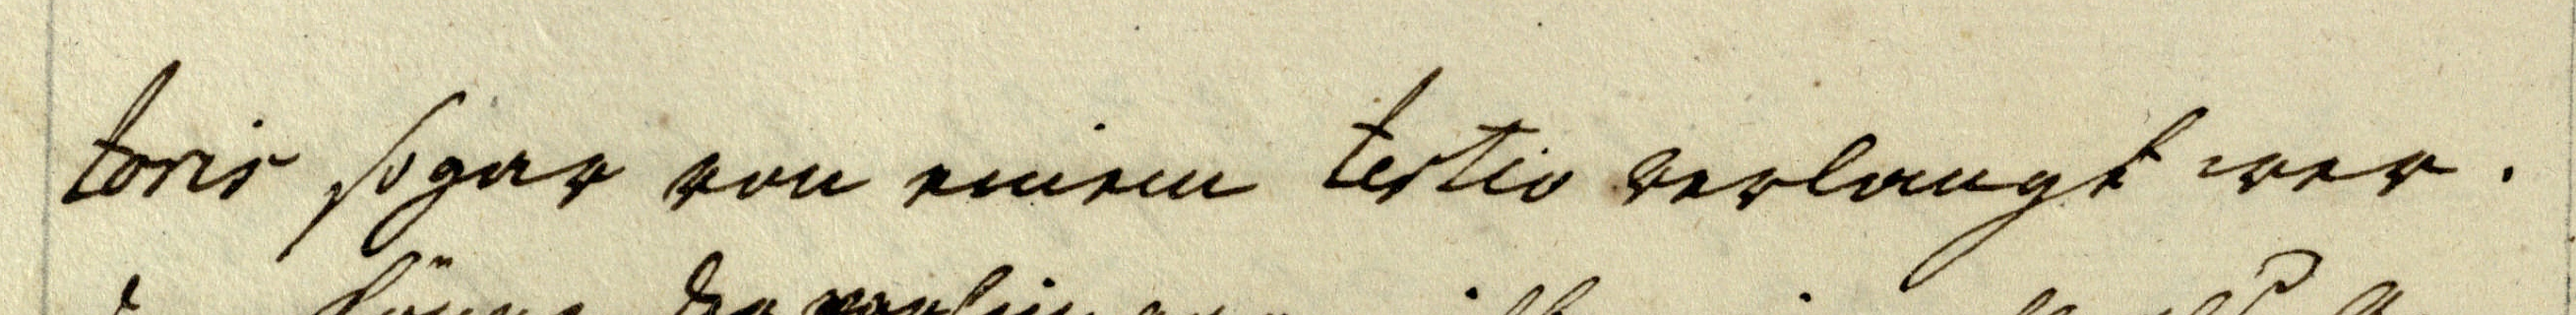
toris sogar von einem tertio verlangt wer¬
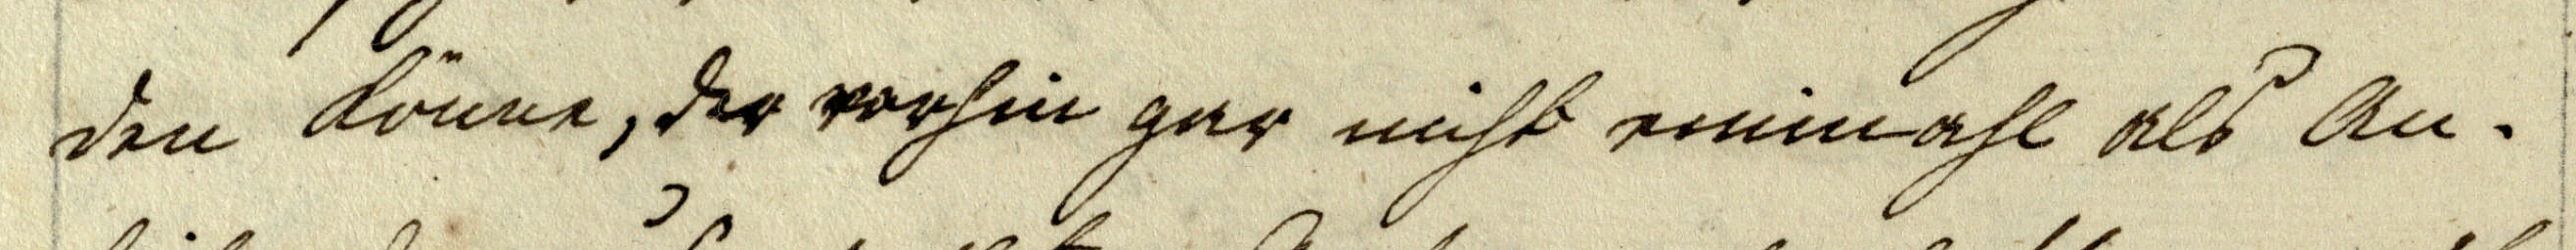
den könne, der vorhin gar nicht einmahl als An¬
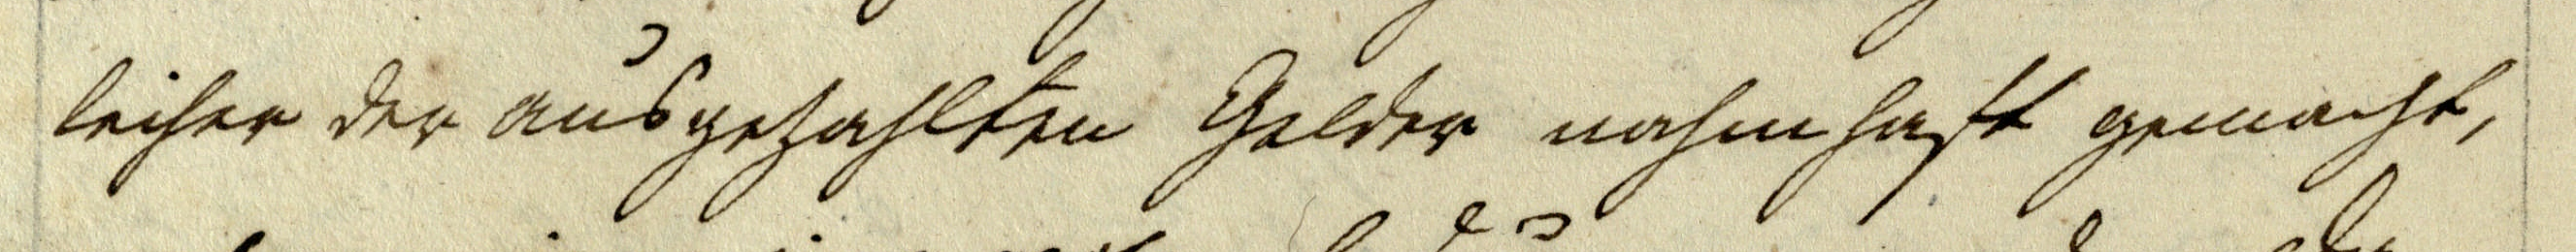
gleicher der ausgezahlten Gelder nahmhaft gemacht,
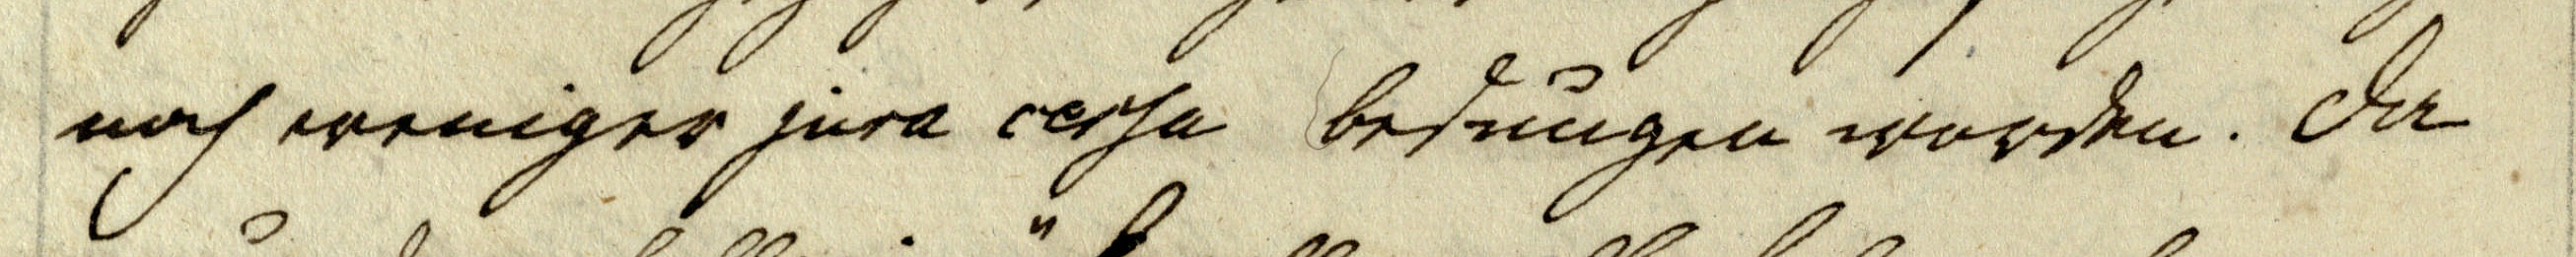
noch weniger jura cessa bedungen worden. Da
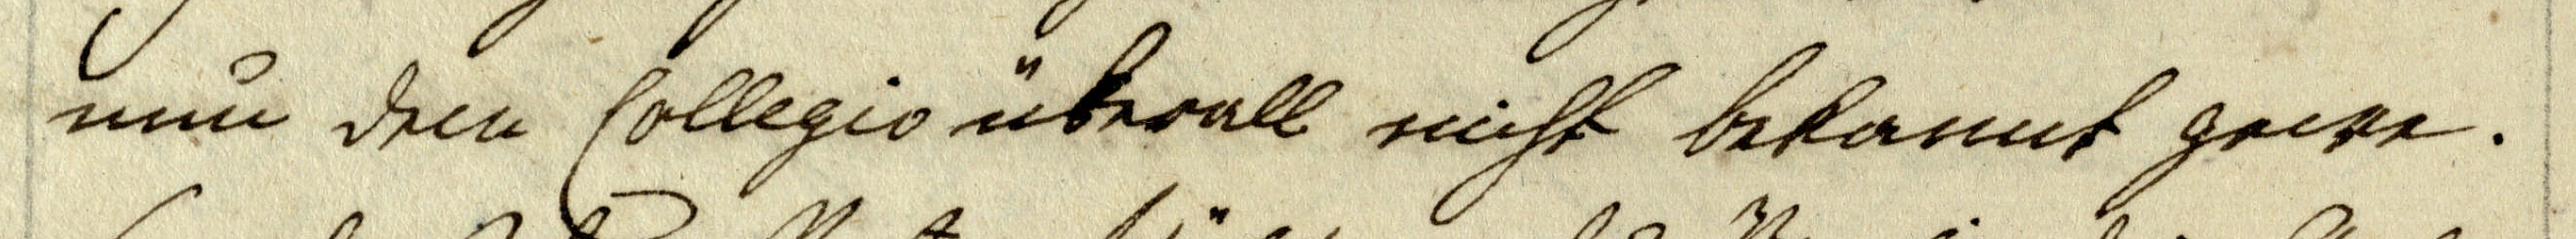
nun dem Collegio überall nicht bekannt gewe¬
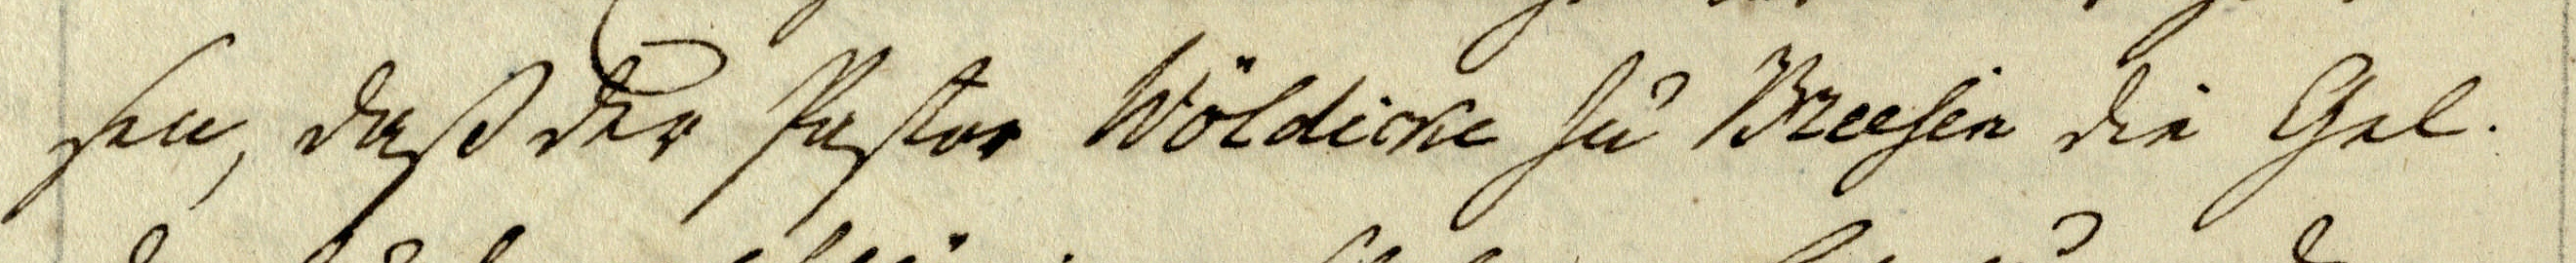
sen, daß der Pastor Wöldicke zu Breesen die Gel¬
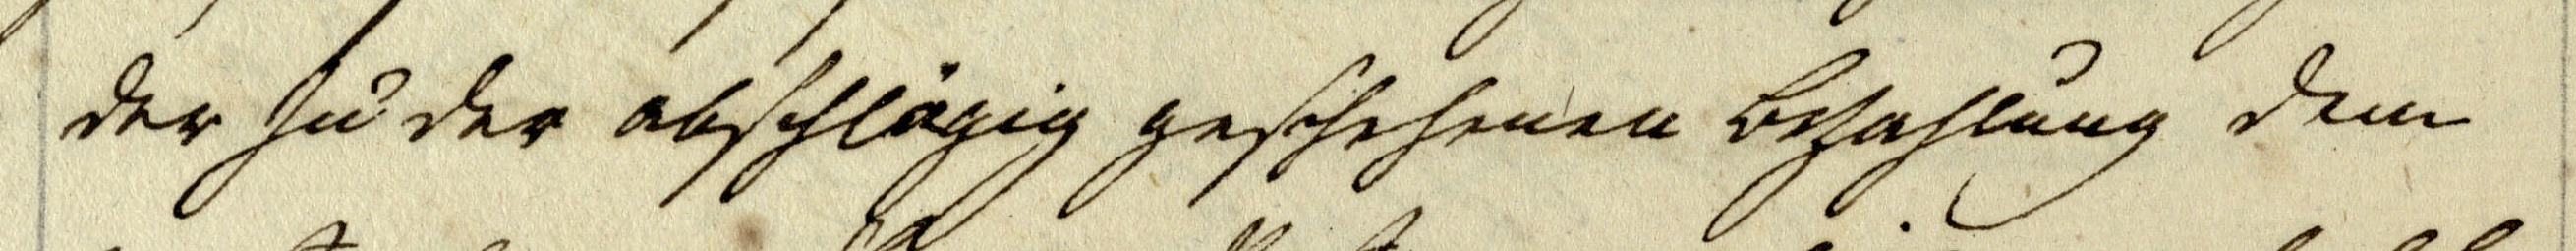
der zu der abschlägig geschehenen Bezahlung dem
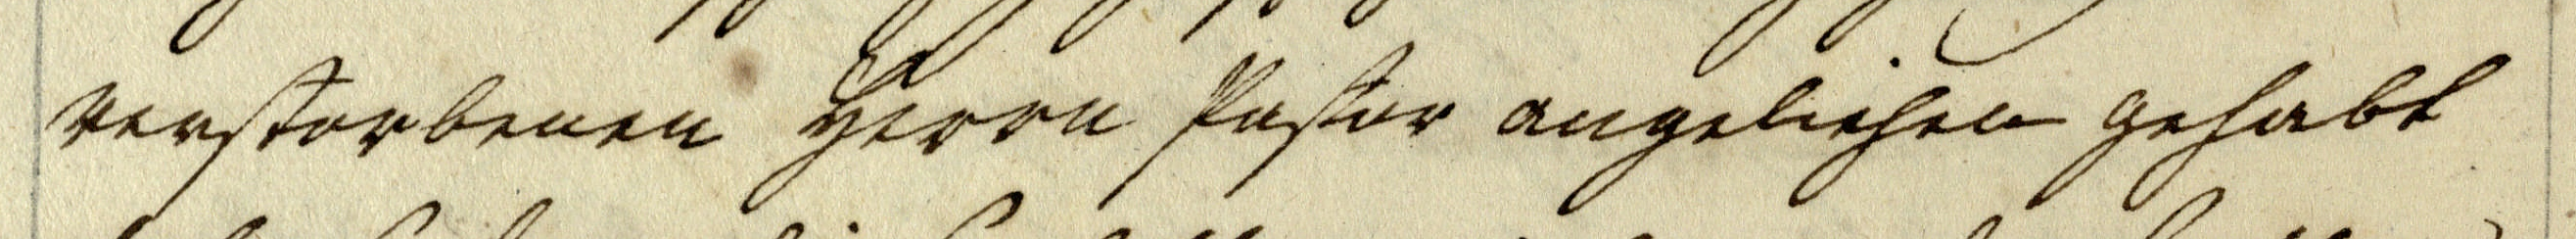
verstorbenen Herrn Pastor angeliehen gehabt
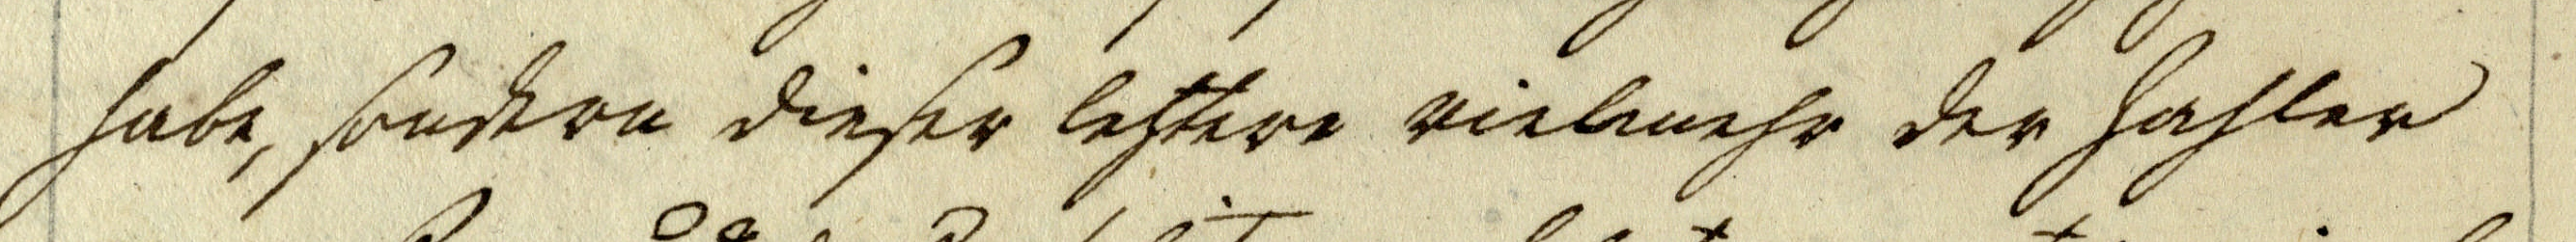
habe, sondern dieser letztere vielmehr der Zahler
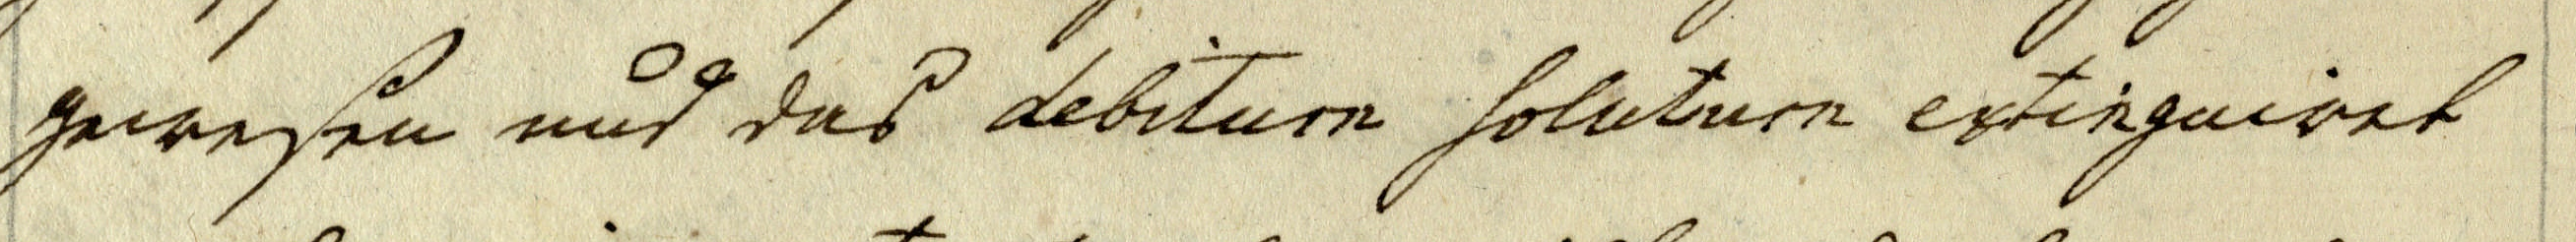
gewesen und das debitum solutum extinguiret
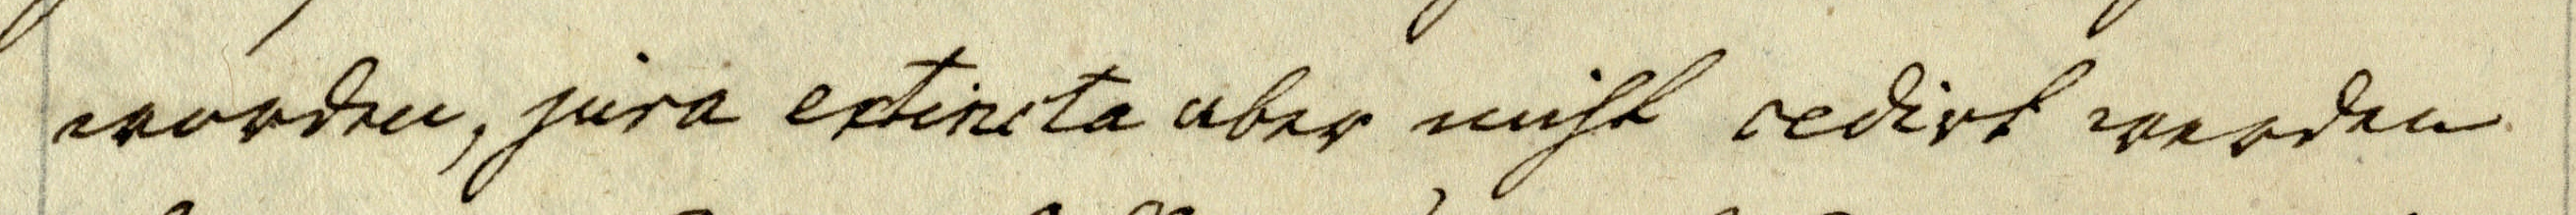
worden, jura extincta aber nicht cedirt werden
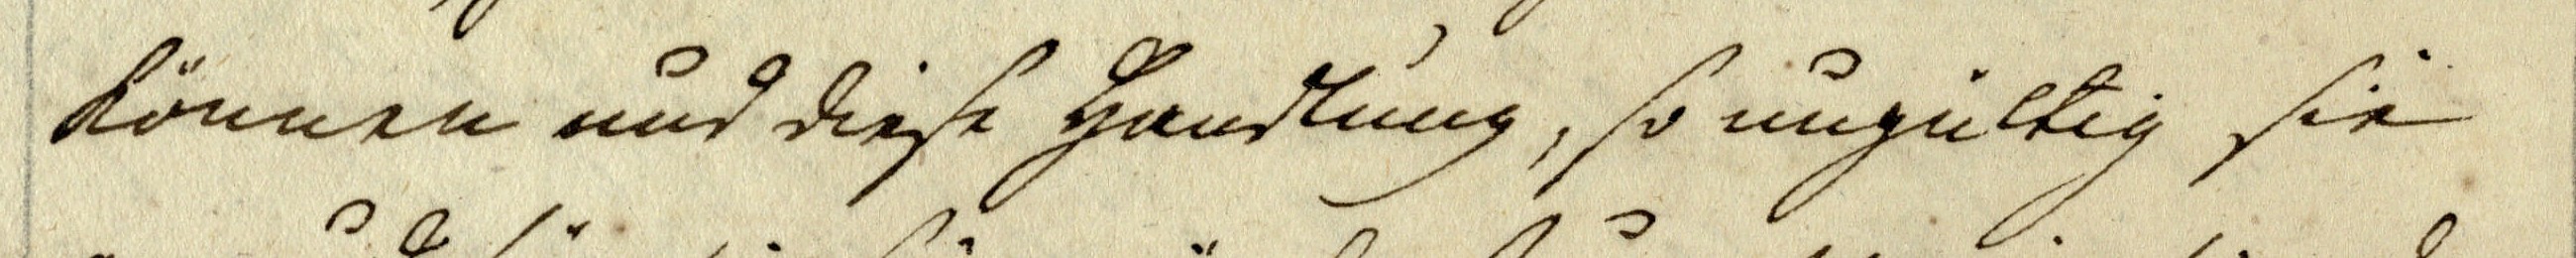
können und diese Handlung, so ungültig sie
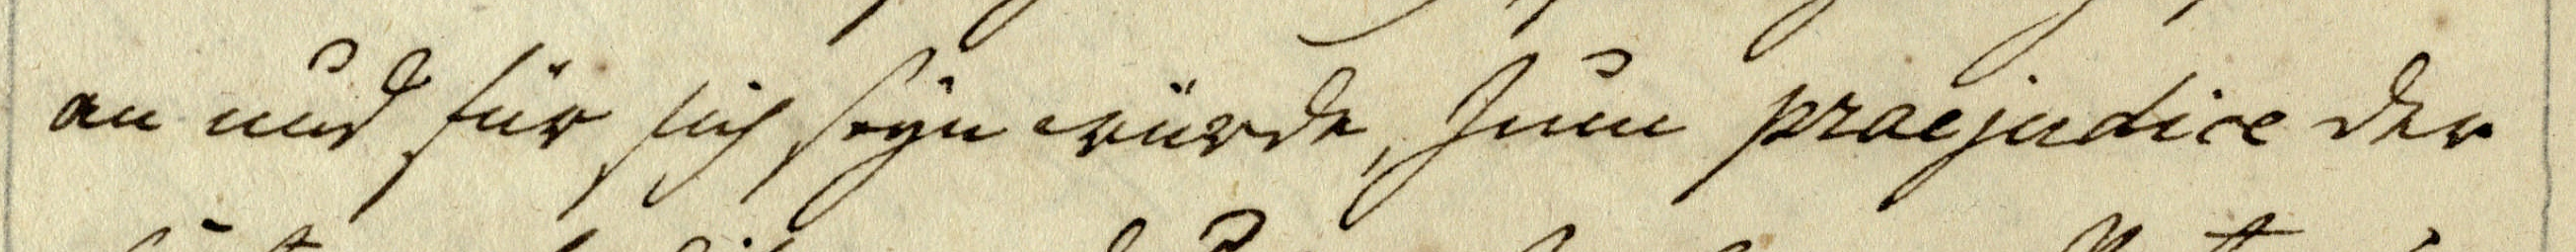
an und für sich seÿn würde, zum praejudice der
